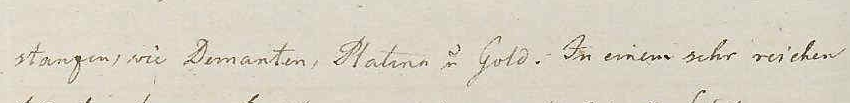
stanzen, wie Demanten, Platina u Gold. In einem sehr reichen
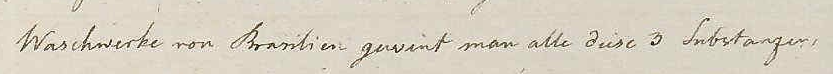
Waschwerke von Brasilien gewint man alle diese 3 Substanzen,
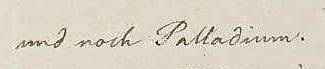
und noch Palladium.
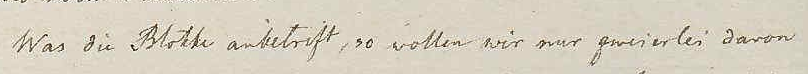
Was die Blökke anbetrift, so wollen wir nur zweierlei davon
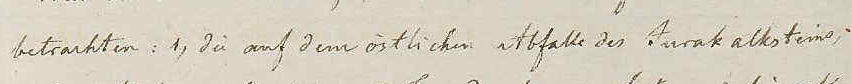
betrachten: 1, die auf dem östlichen Abfalle des Jurakalksteins,
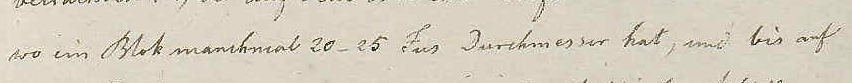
wo ein Blok manchmal 20–25 Fus Durchmesser hat, und bis auf
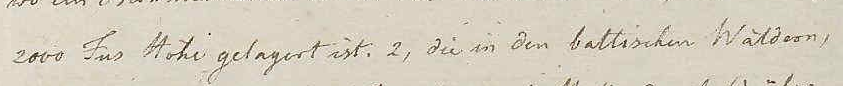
2000 Fus Höhe gelagert ist. 2, die in den baltischen Wäldern,
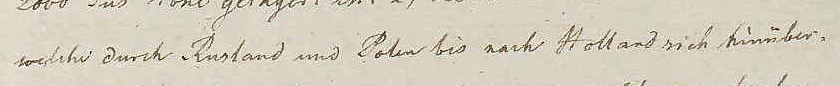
welche durch Rusland und Polen bis nach Holland sich hinüber-
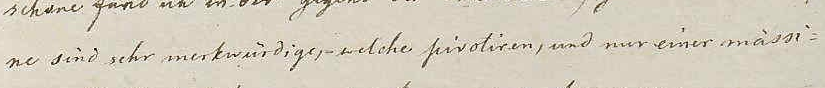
ne sind sehr merkwürdige, welche pivotiren, und nur einer mässi-
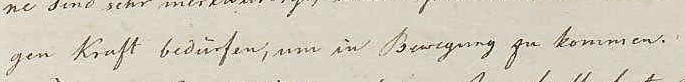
gen Kraft bedürfen, um in Bewegung zu kommen.
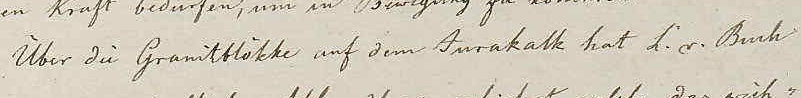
Über die Granitblökke auf dem Jurakalk hat L. v. Buch
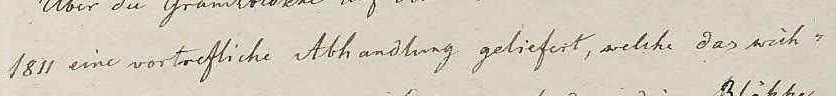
1811 eine vortrefliche Abhandlung geliefert, welche das wich-
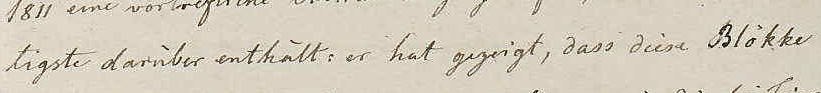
tigste darüber enthält: er hat gezeigt, dass diese Blökke
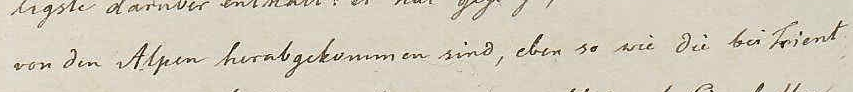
von den Alpen herabgekommen sind, eben so wie die bei Trient.
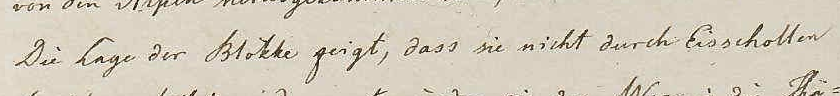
Die Lage der Blökke zeigt, dass sie nicht durch Eisschollen
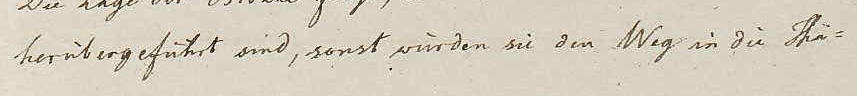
herübergeführt sind, sonst würden sie den Weg in die Thä-
